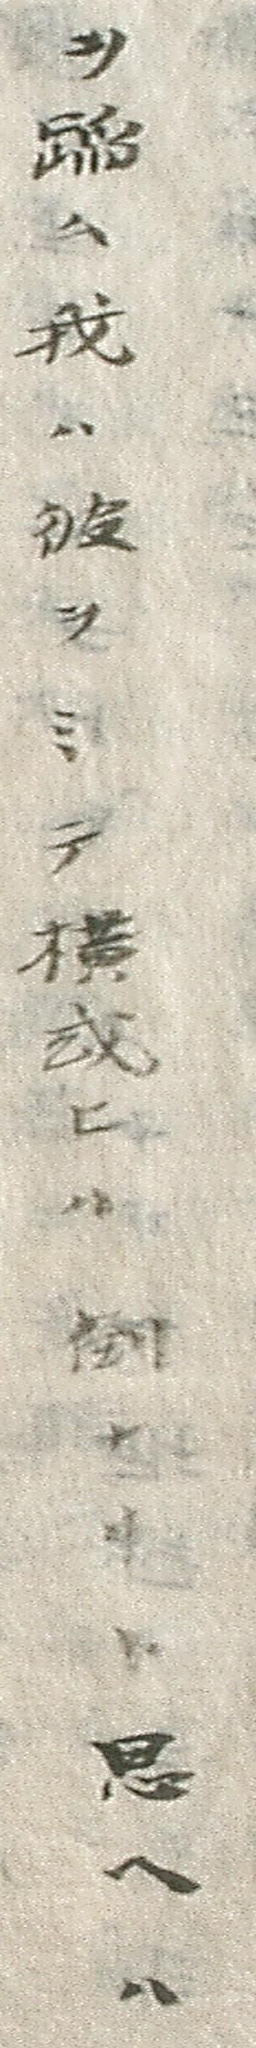ヲ踏ム我ハ彼ヲミテ横或ヒハ倒ナリト思ヘハ
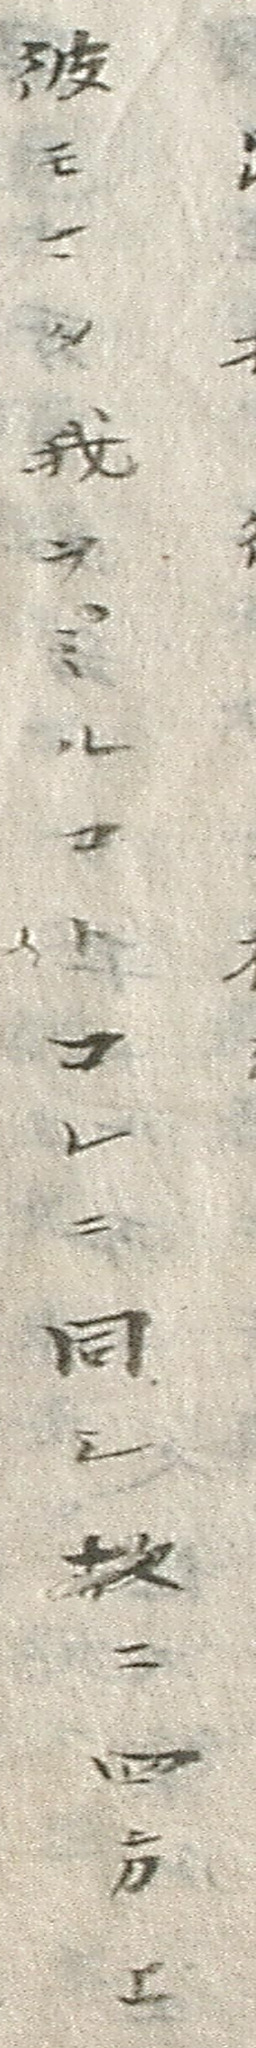彼モマタ我ヲミルコトコレニ同シ故ニ四方上
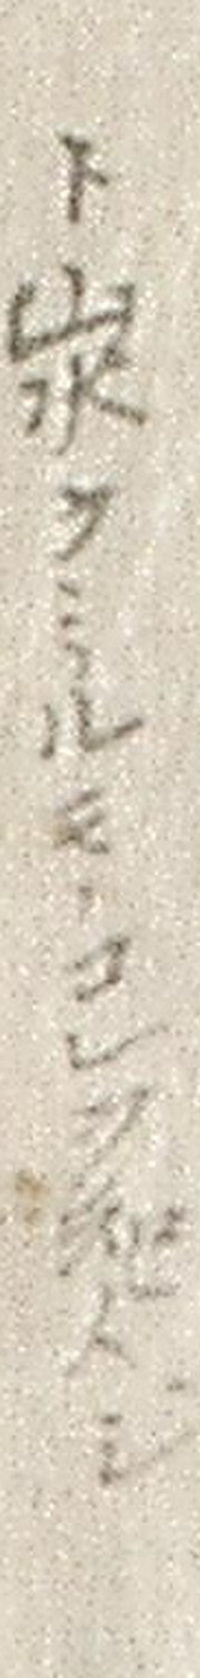ト山水ヲミルモノコレヲ知ルヘシ
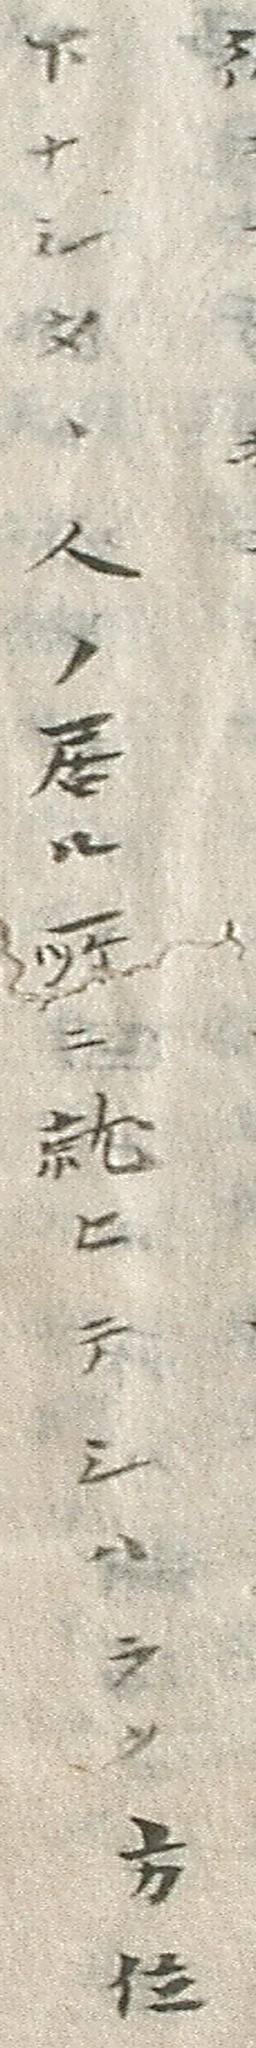下ナシタヽ人ノ居ル所ニ就ヒテシハラク方位
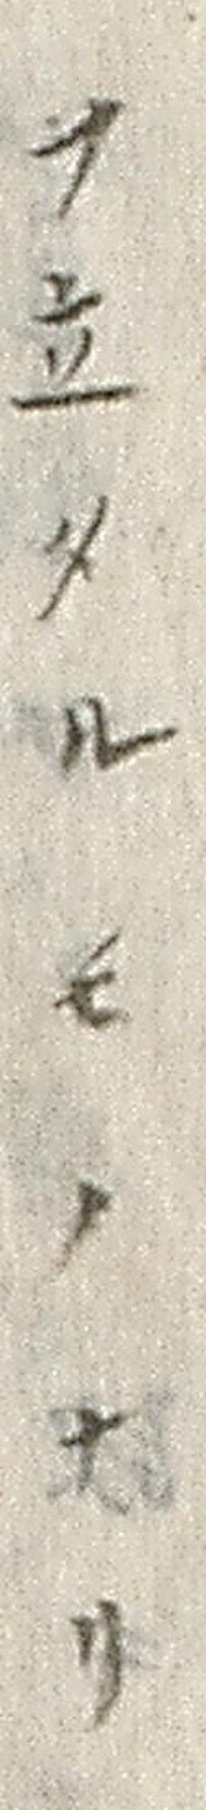ヲ立タルモノナリ
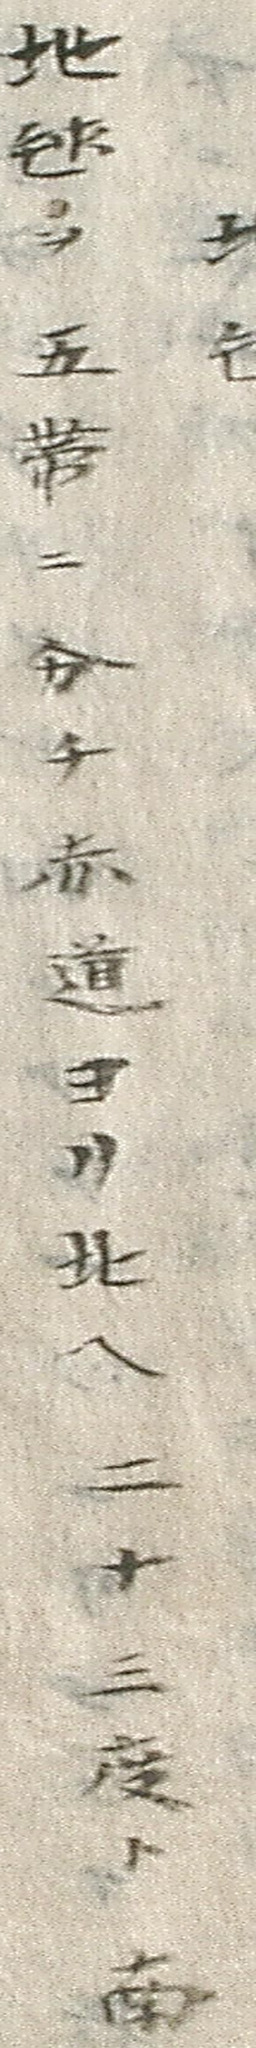地毬ヲ五帯ニ分チ赤道ヨリ北ヘ二十三度ト南
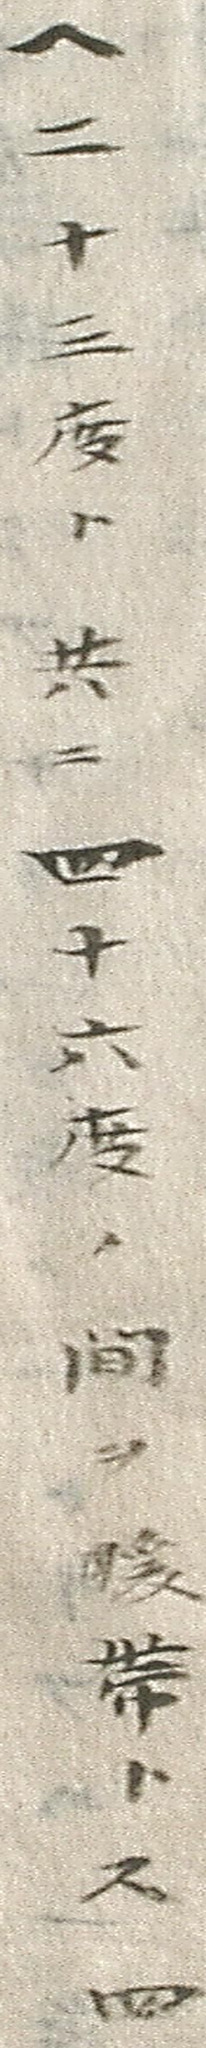ヘ二十三度ト共ニ四十六度の間ヲ暖帯トス四
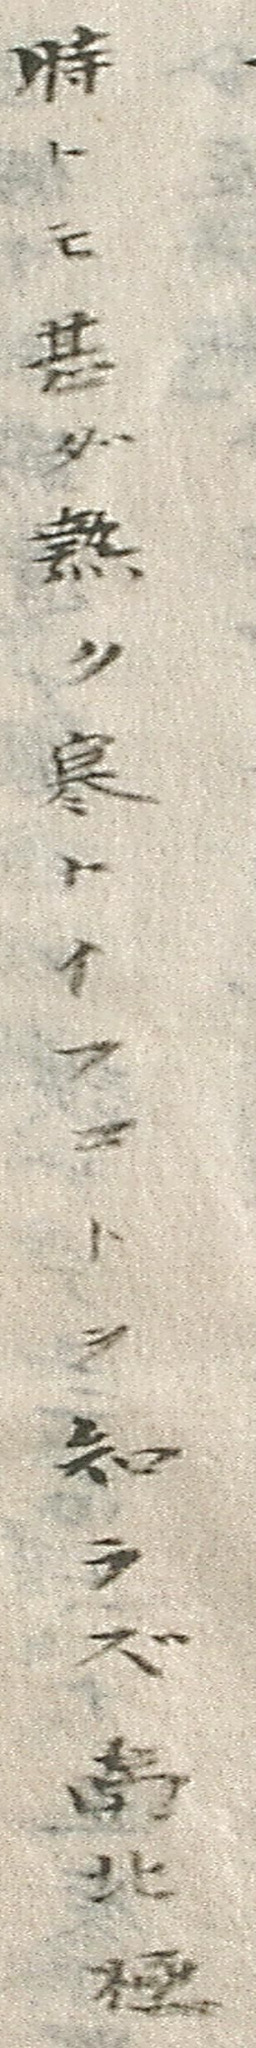時トモ甚ダ熱ク寒トイフコトヲ知ラズ南北極
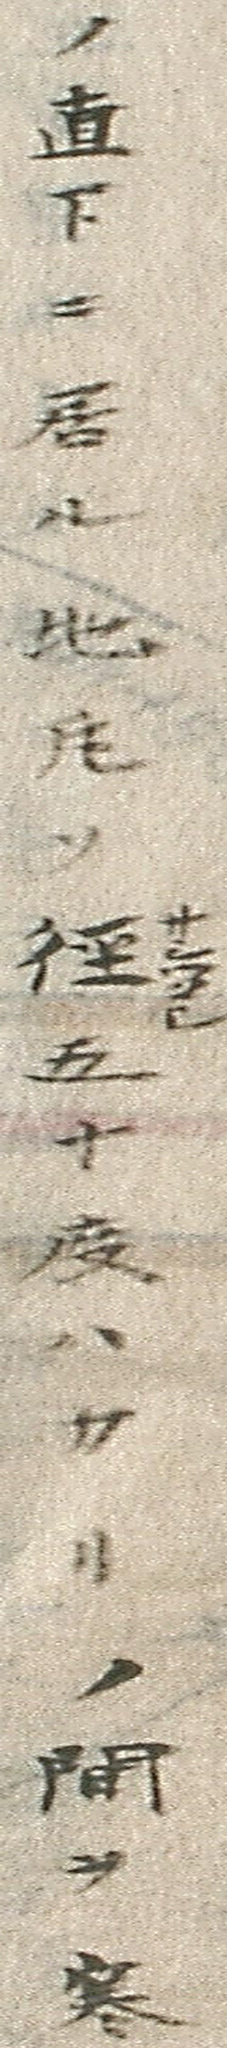ノ直下ニ居ル地凡ソ径五十度ハカリノ間ヲ寒
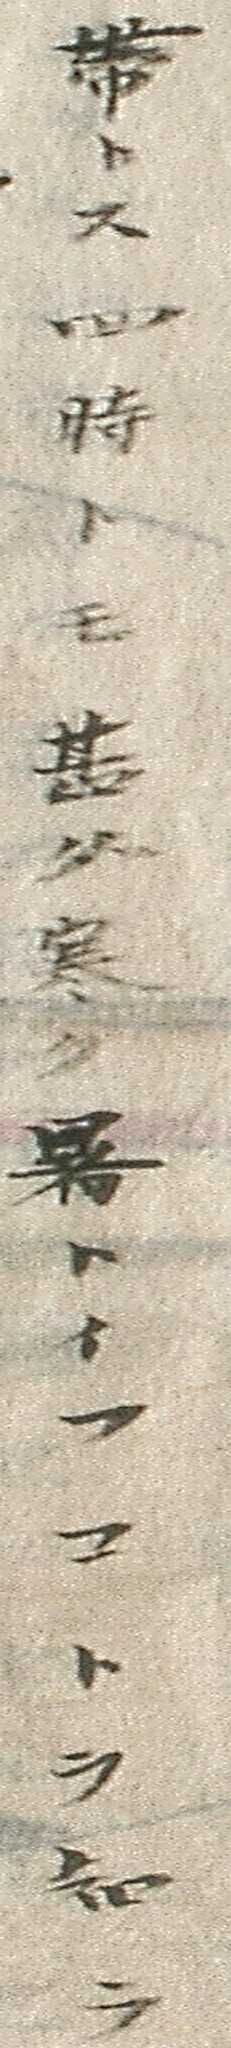帯トス四時トモ甚ダ寒ク暑トイフコトヲ知ラ
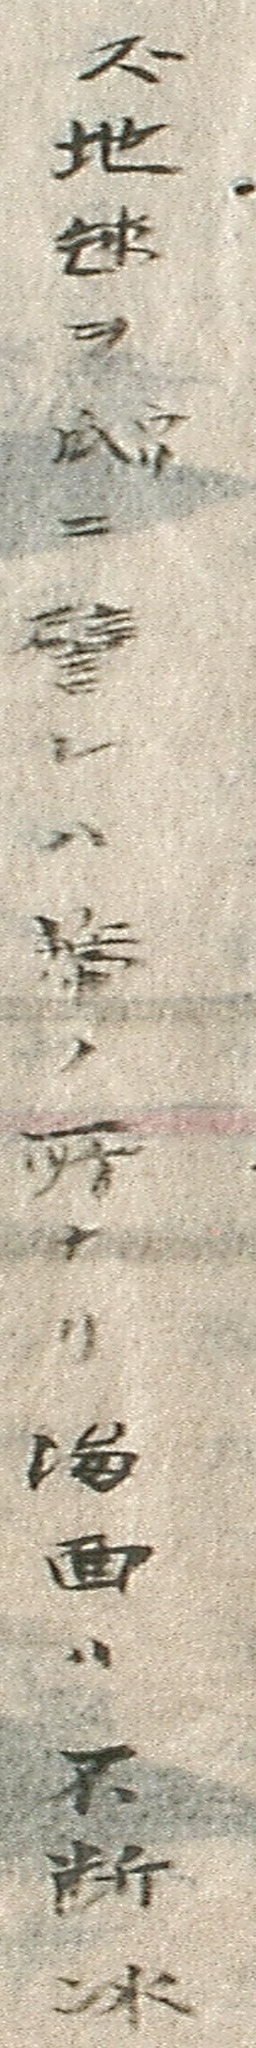ズ地毬ヲ瓜ニ譬レハ帯ノ所ナリ海面ハ不断冰
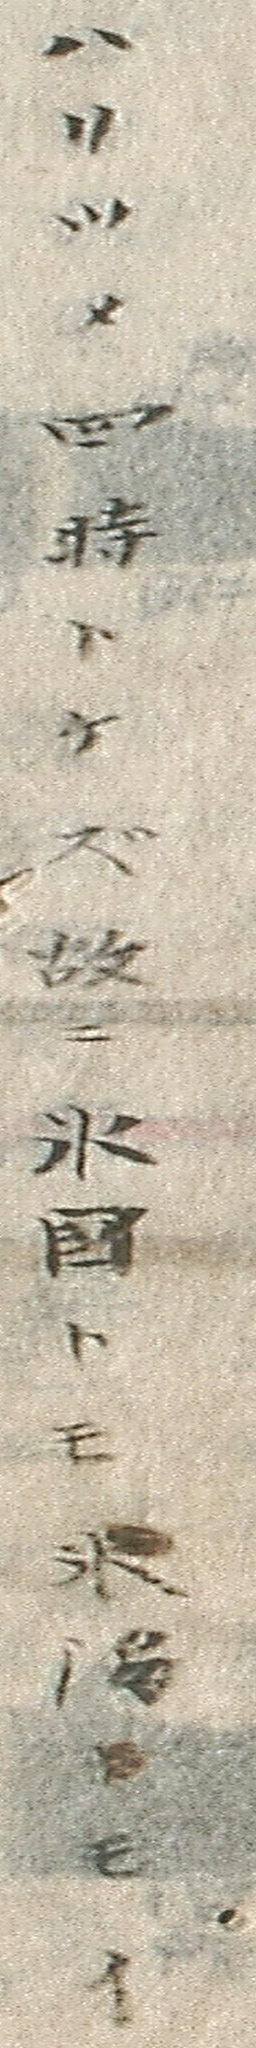ハリツメ四時トケズ故ニ氷国トモ氷海トモイ
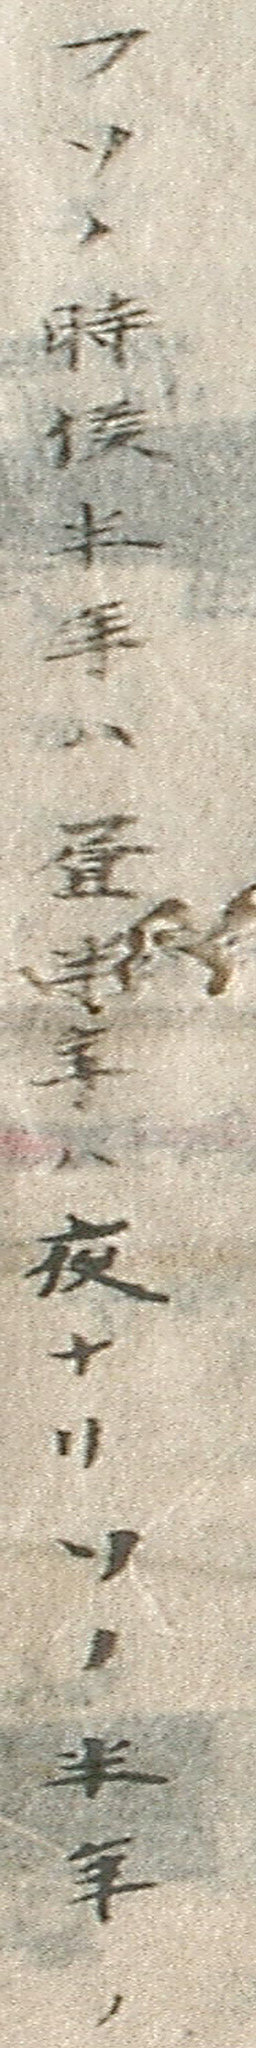フソノ時侯半年ハ昼半年ハ夜ナリソノ半年ノ
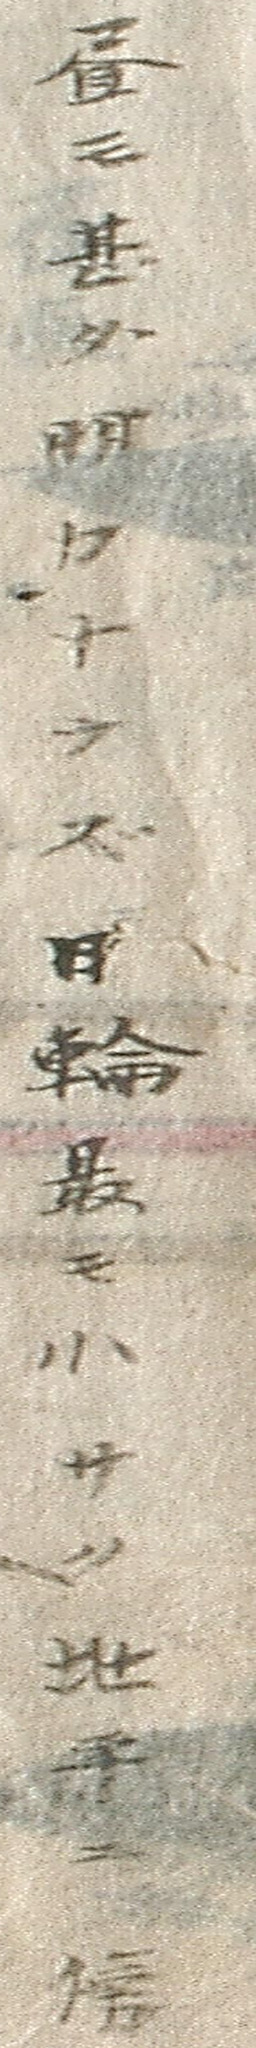昼モ甚ダ明カナラズ日輪最モ小サク地平ニ傍
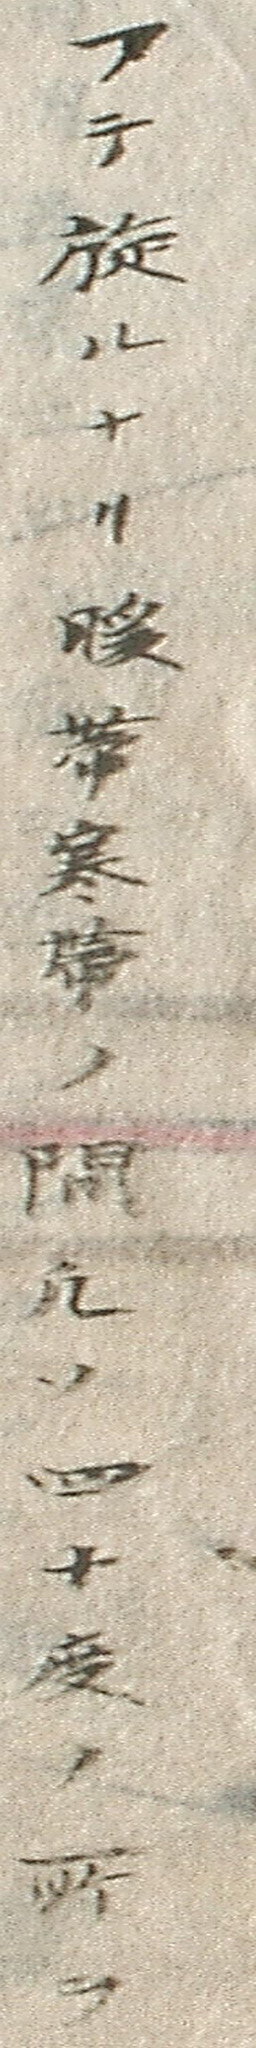フテ旋ルナリ暖帯寒帯ノ間凡ソ四十度ノ所ヲ
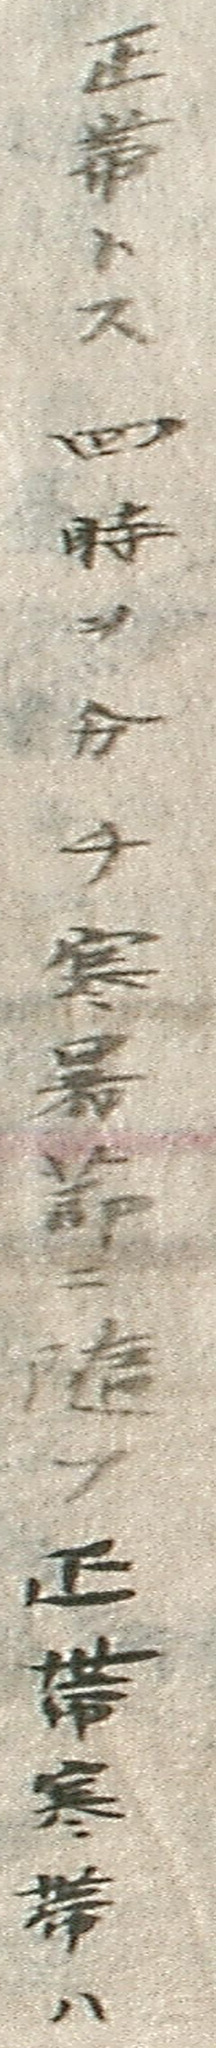正帯トス四時ヲ分チ寒暑節ニ随フ正帯寒帯ハ
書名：天學便蒙図説
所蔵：東京大学地震研究所図書室 Earthquake Research Institute Library, The University of Tokyo, JAPAN
